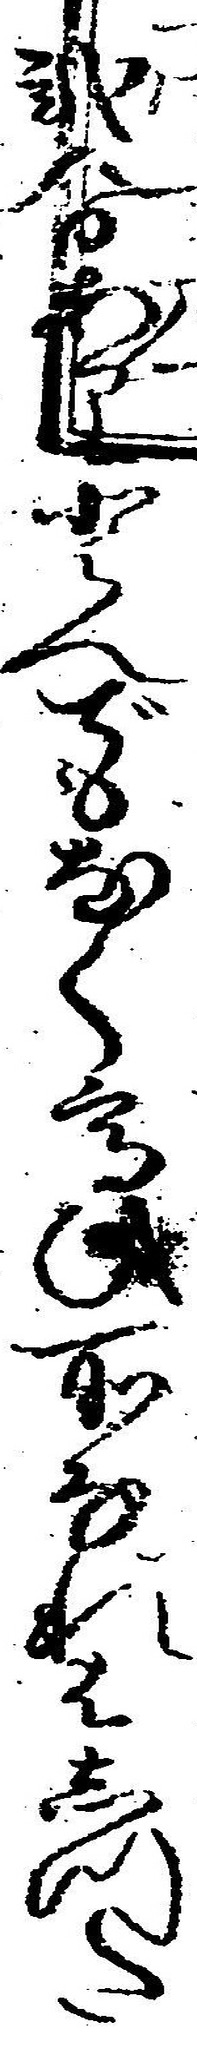弐分ありとんでもなく高ひ所なれはしつた
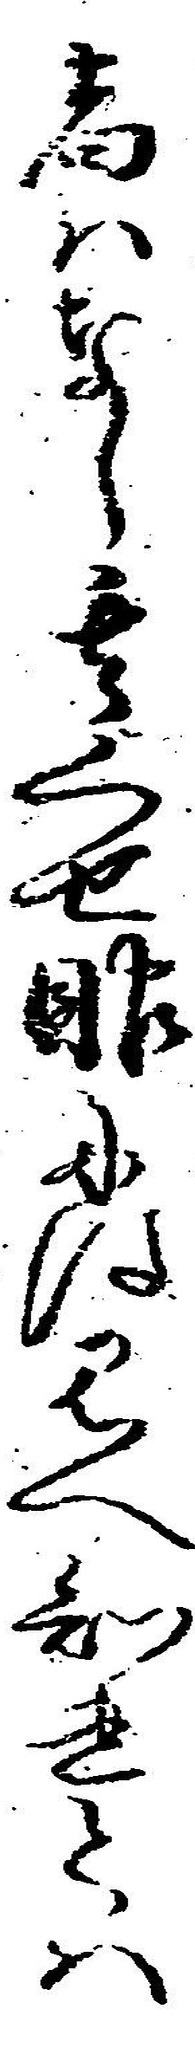者はなし其くせ眼には見へ知れとは
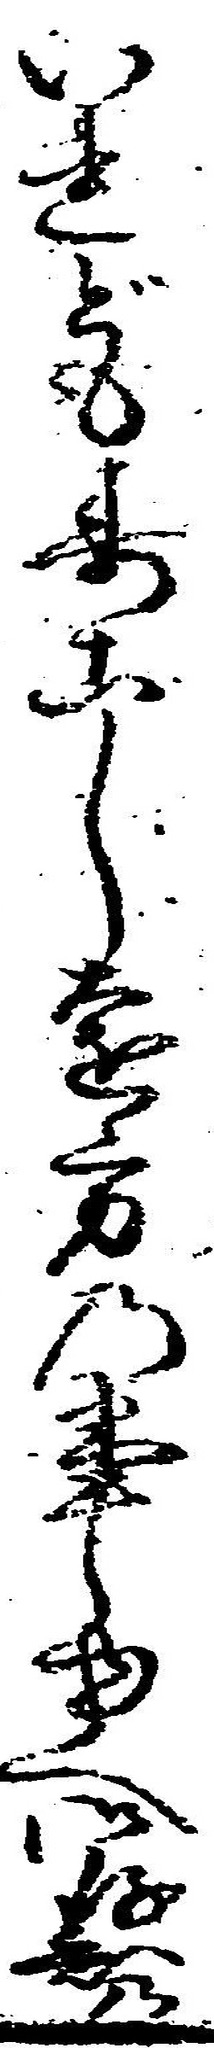いれどもすこし遠方の事ゆへ御存知の
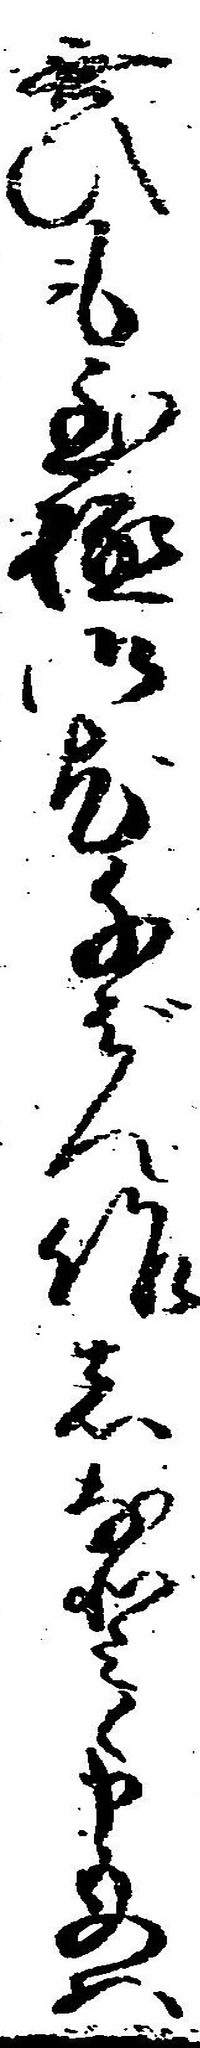無ひも至極御尤千ばん作者なとゝ申ものは
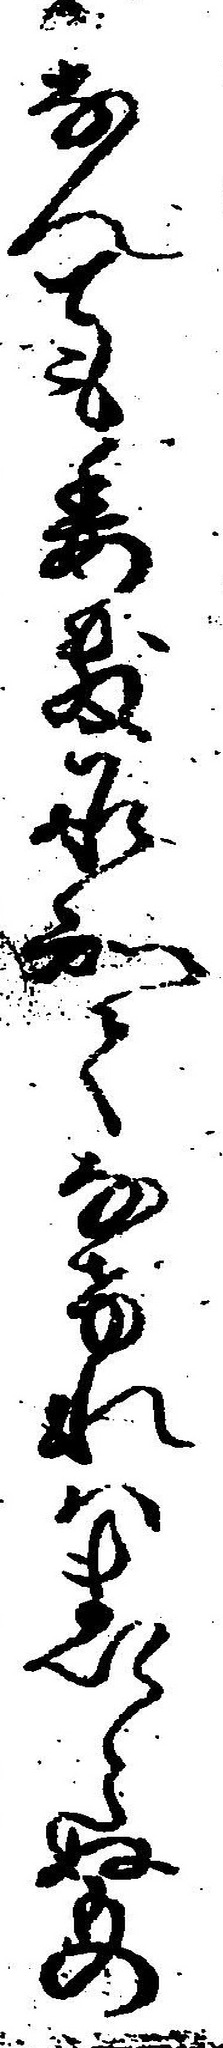なんても委敷承知てなけれはまいらぬもの
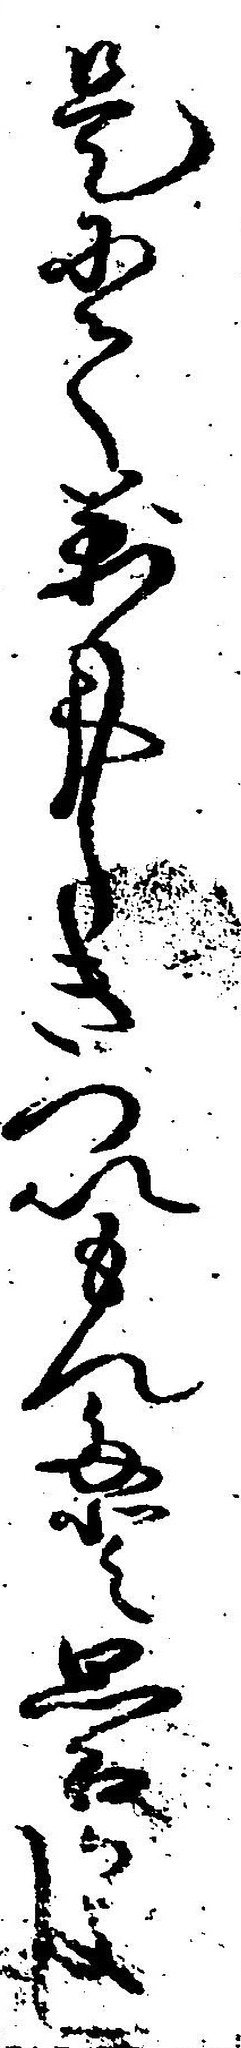是にて万事きついもんたと思召かよし
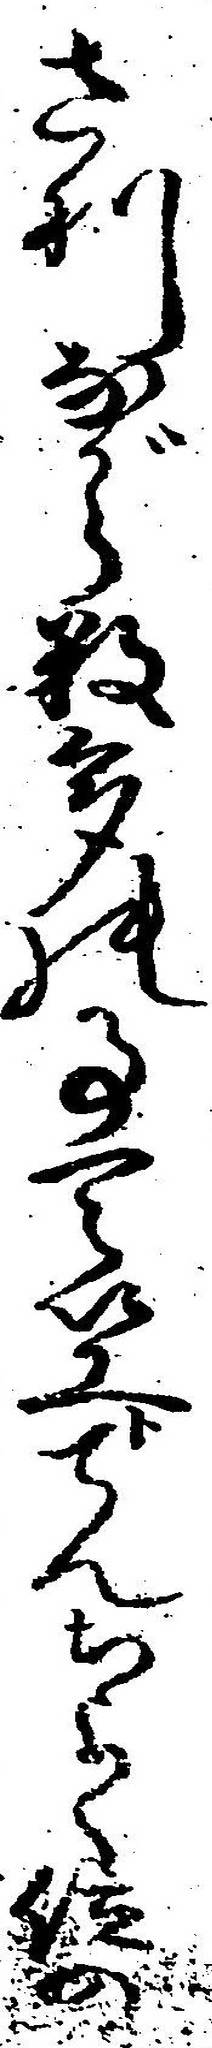さりながら数多の事天竺位の
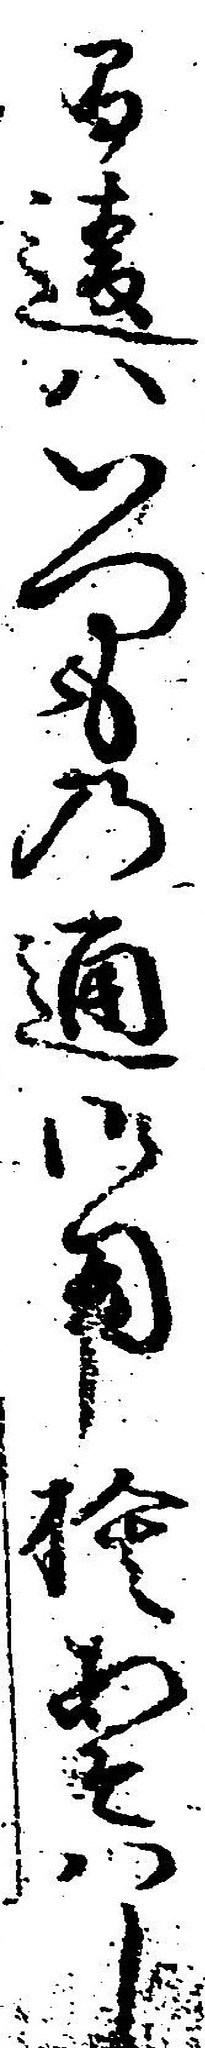間違はいつもの通御用捨あそはし
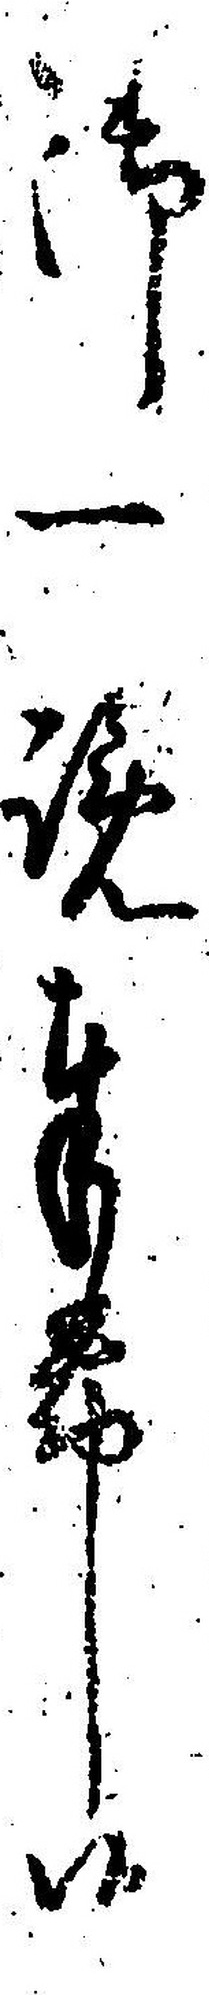御一覧奉希候

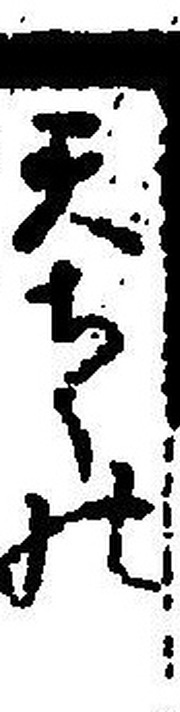天ちくの
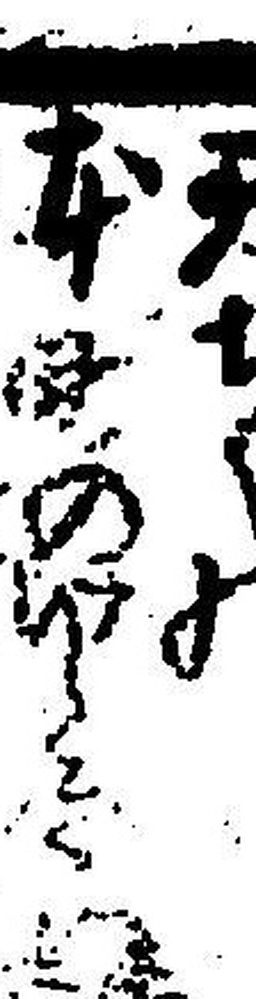本町のけしき
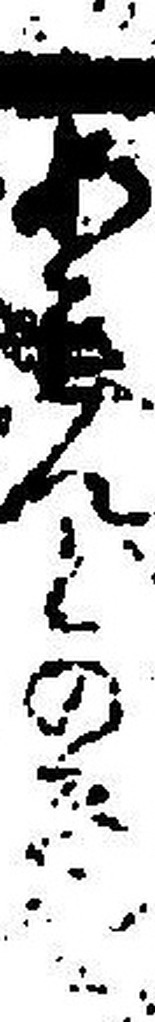あきんどのき
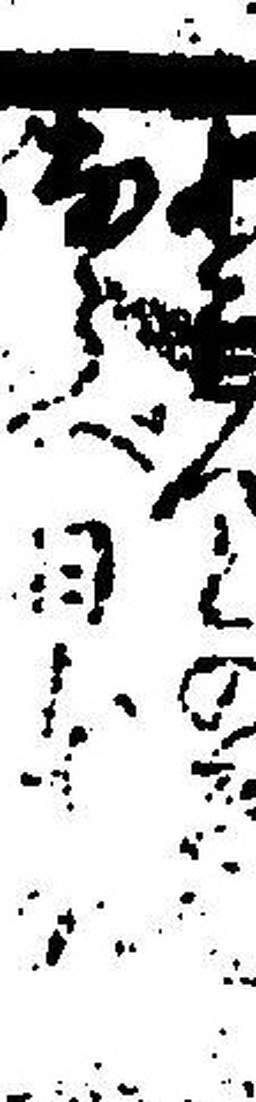ならべ日本
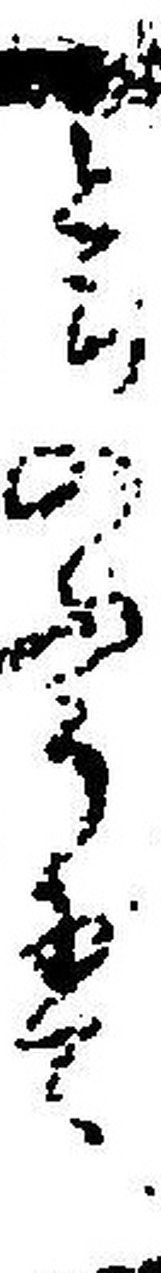とのふうにて
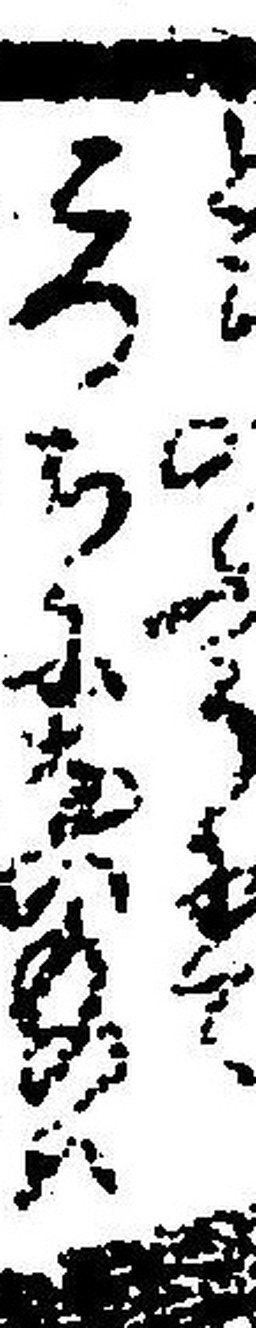こつちにないものは
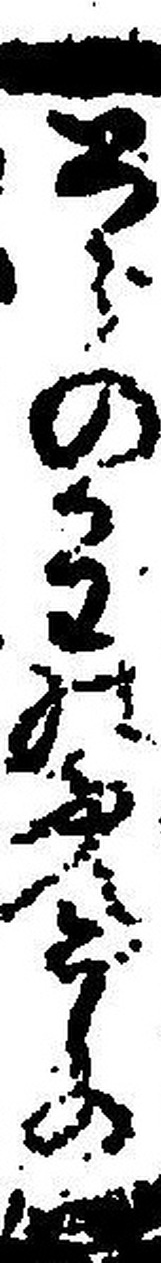とらのかわのふんどしの
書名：天竺儲之筋 / 市場通笑作
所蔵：東京大学総合図書館 General Library in the University of Tokyo, JAPAN
